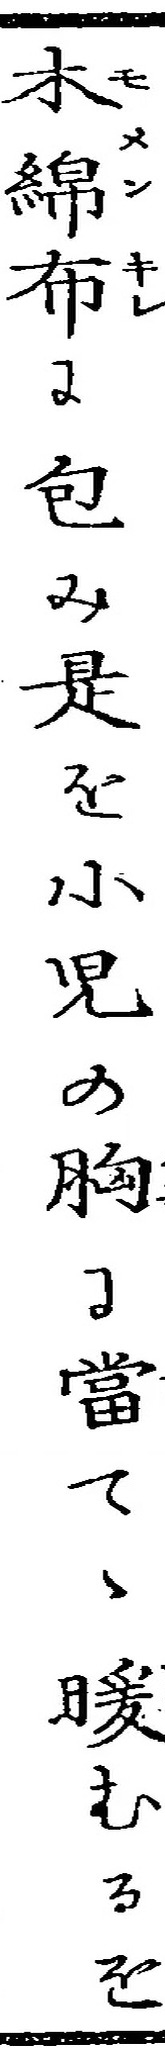木綿布に包み是を小児の胸に当てゝ暖むるを
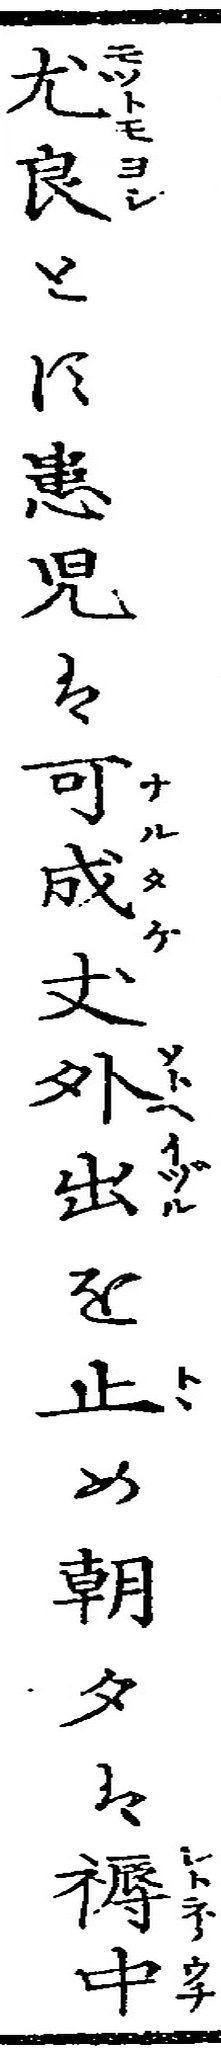尤良とす患児は可成丈外出を止め朝夕は褥中
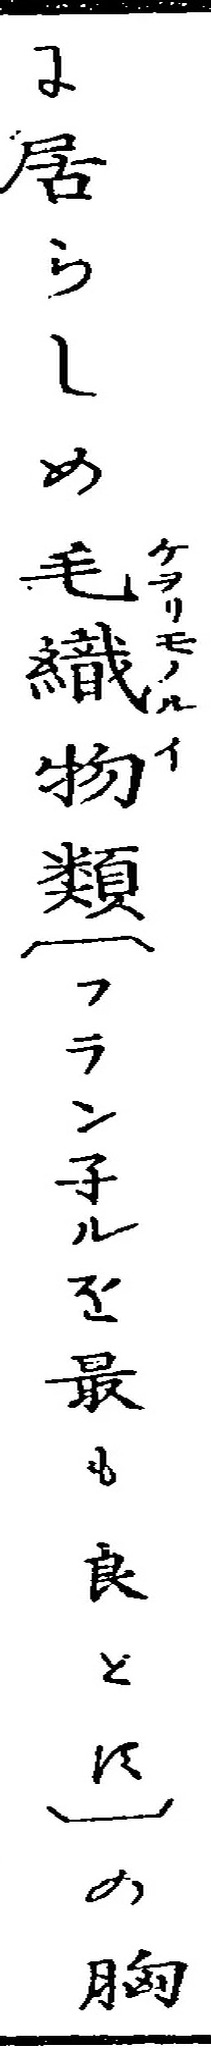に居らしめ毛織物類[フランネルを最も良とす]の胸
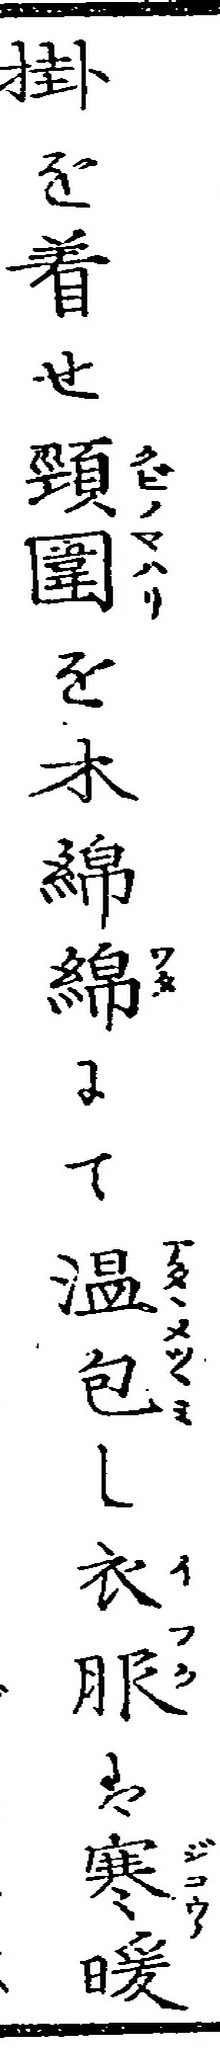掛を着せ頸囲を木綿綿にて温包し衣服は寒暖
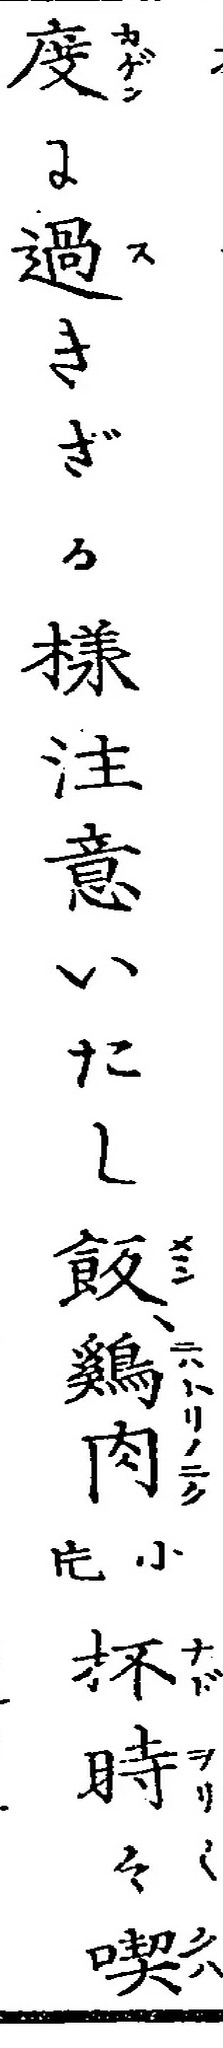度に過きざる様注意いたし飯、鶏肉小片杯時々喫
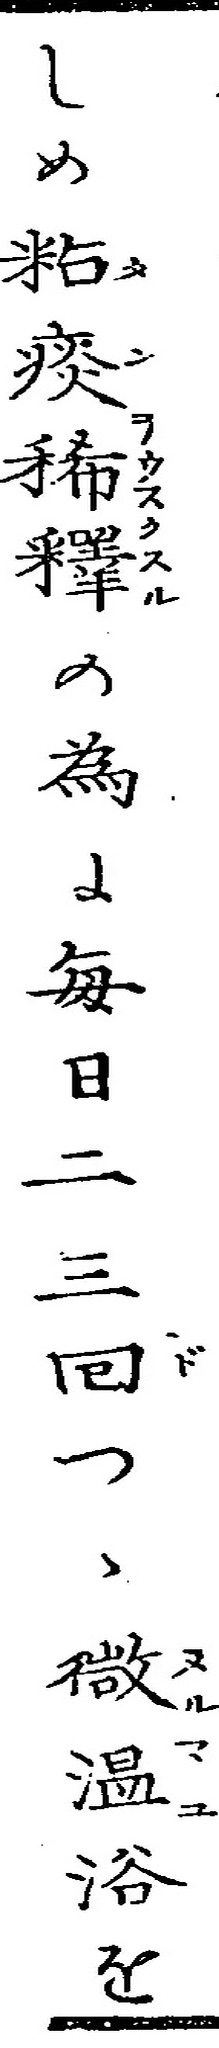しめ粘痰稀釈の為に毎日二三回つゝ微温浴を
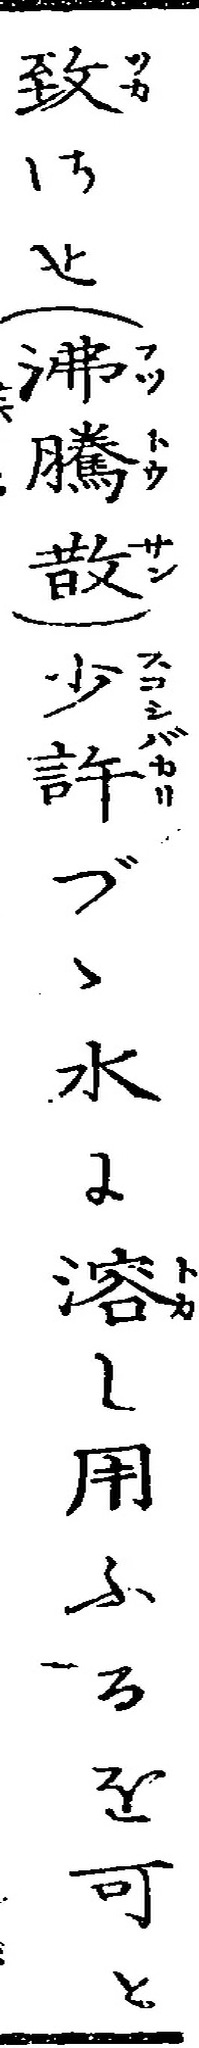致させ[沸騰散]少許づゝ水に溶し用ふるを可と
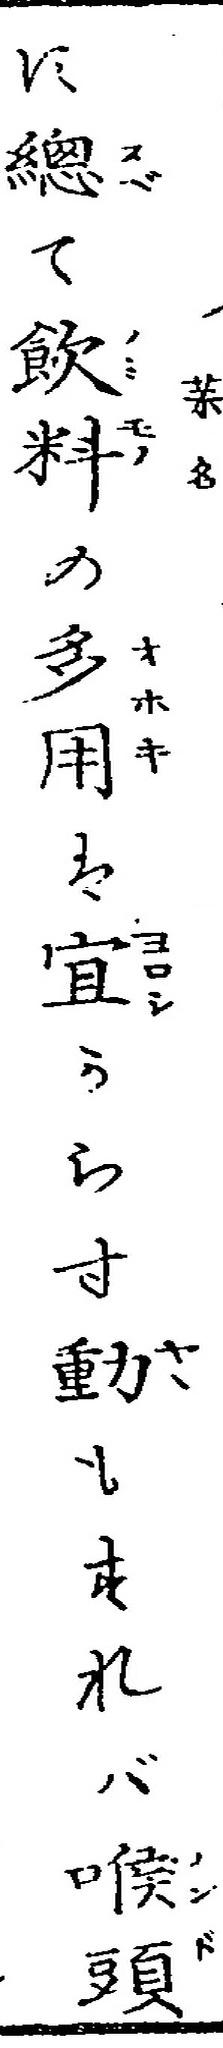す総て飲料の多用は宜からす動もすれば喉頭
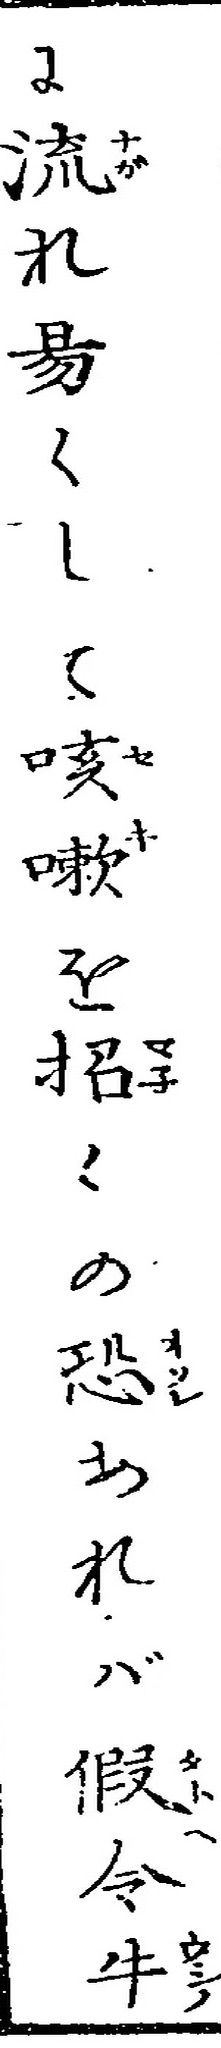に流れ易くして咳嗽を招くの恐あれば假令牛
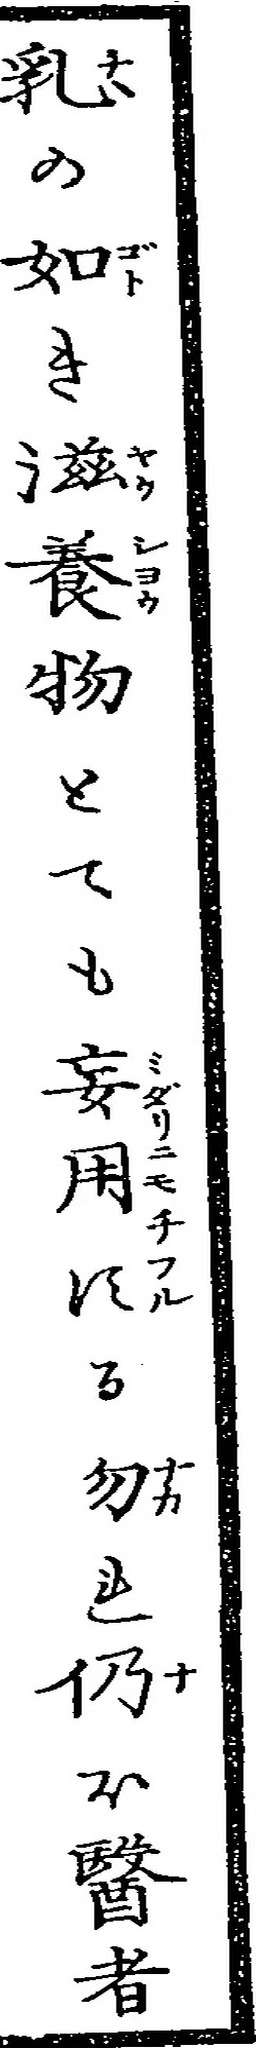乳の如き滋養物とても妄用する勿れ仍ほ医者
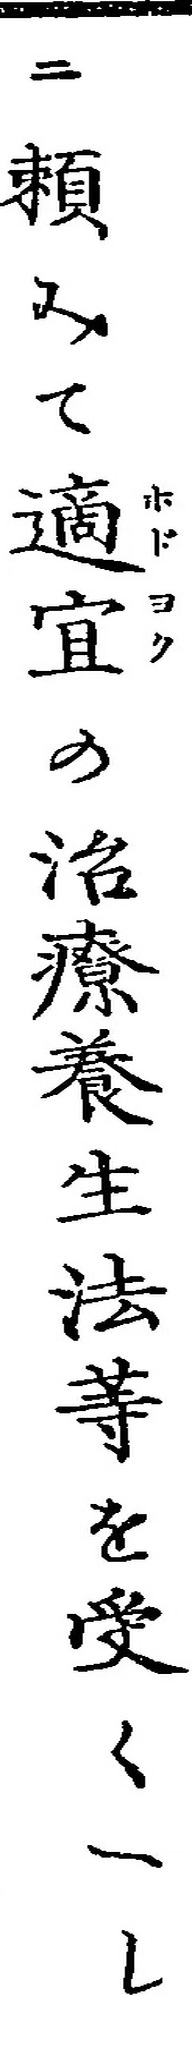に頼みて適宜の治療養生法等を受くへし
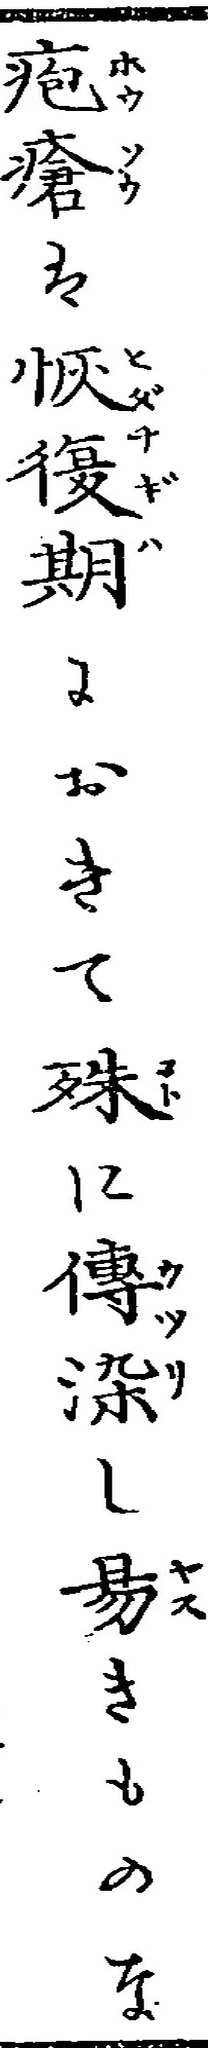疱瘡は恢復期におきて殊に伝染し易きものな
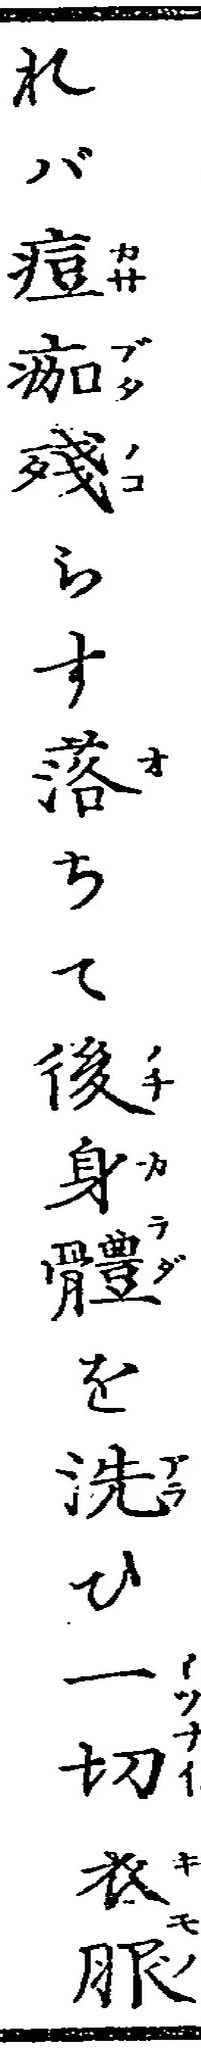れば痘痂残らす落ちて後身体を洗ひ一切衣服
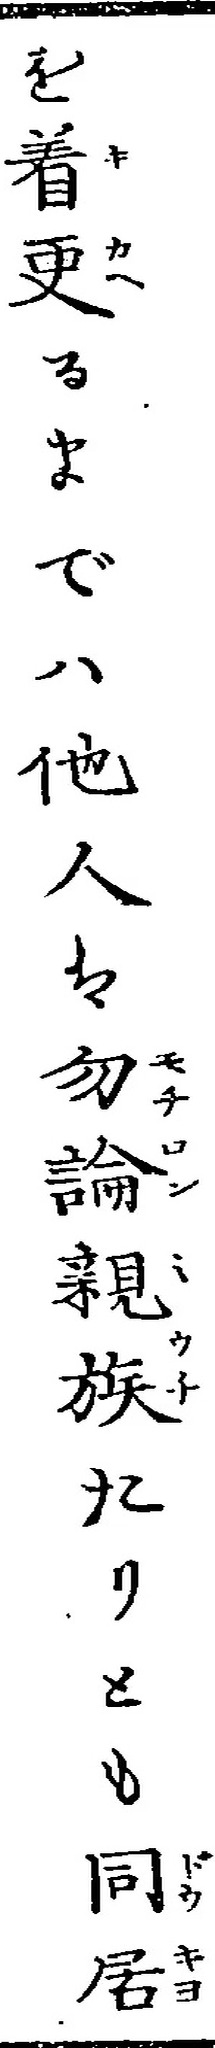を着更るまでは他人は勿論親族たりとも同居
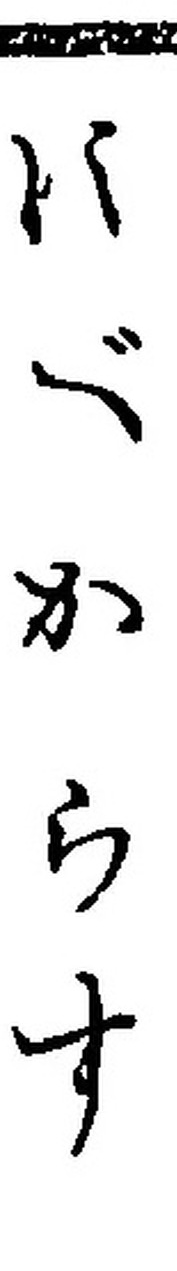すべからす
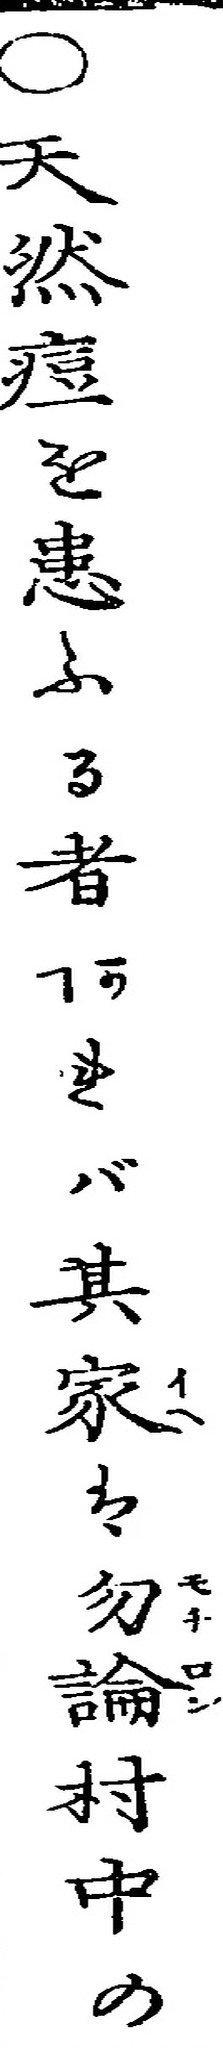○天然痘を患ふる者あれば其家は勿論村中の
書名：伝染病予防法
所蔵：国立国会図書館 National Diet Library, JAPAN
